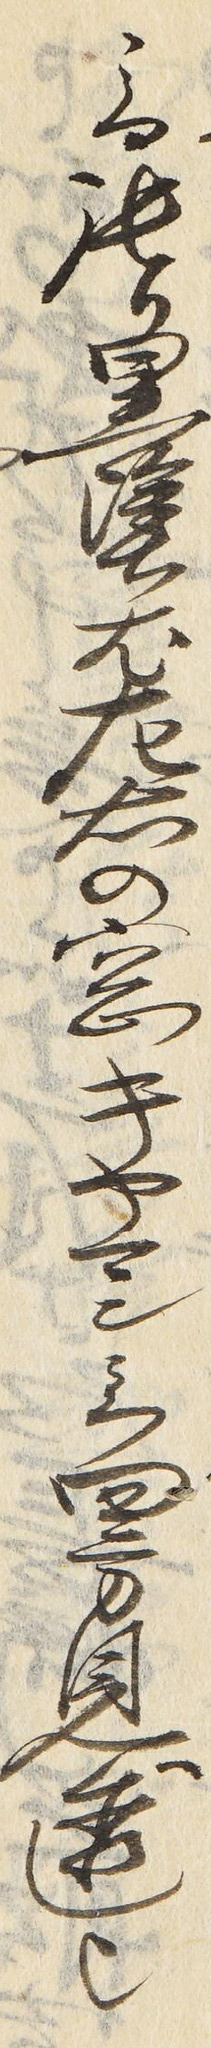ニ而張り黒塗尤左右の窓キヤマンニ而四方見へ透申候
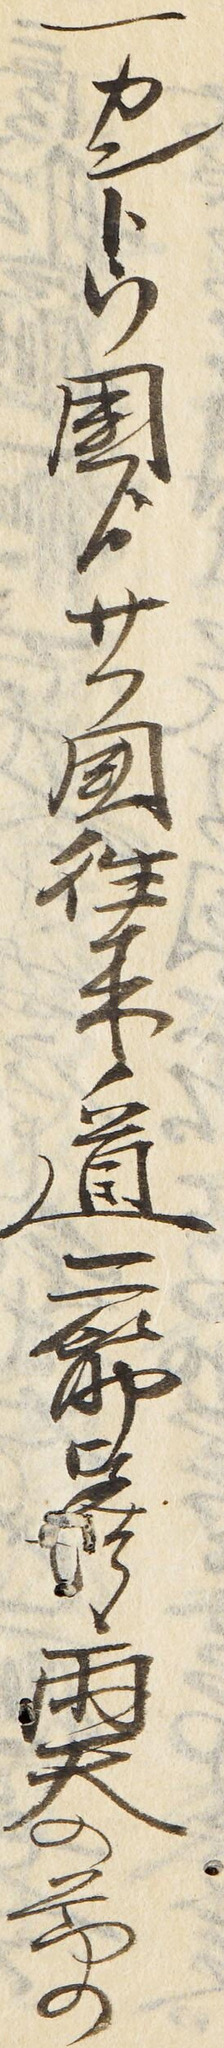一カントウ国ゟサフ国往来ノ道二筋御座候雨天の節の
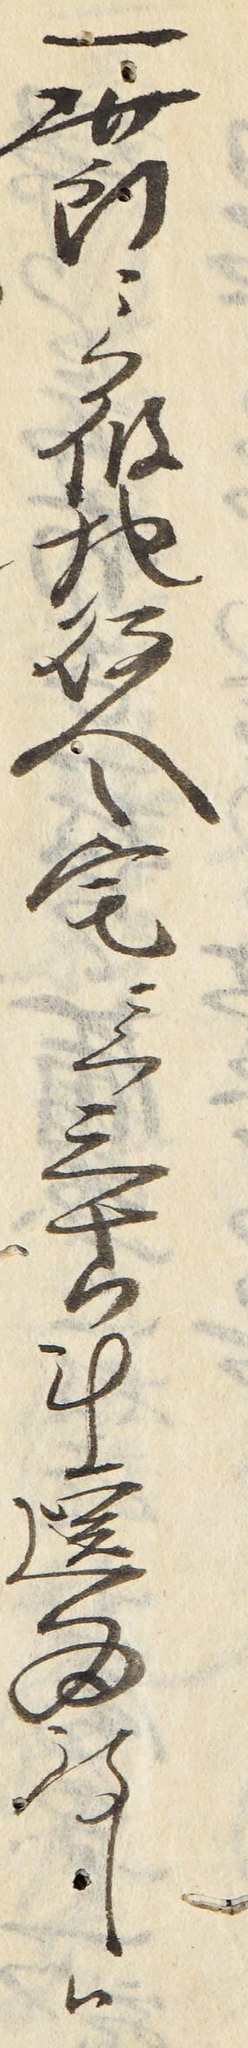一此所ニ而彼地役人之宅ニ而三十日計逗留致し候
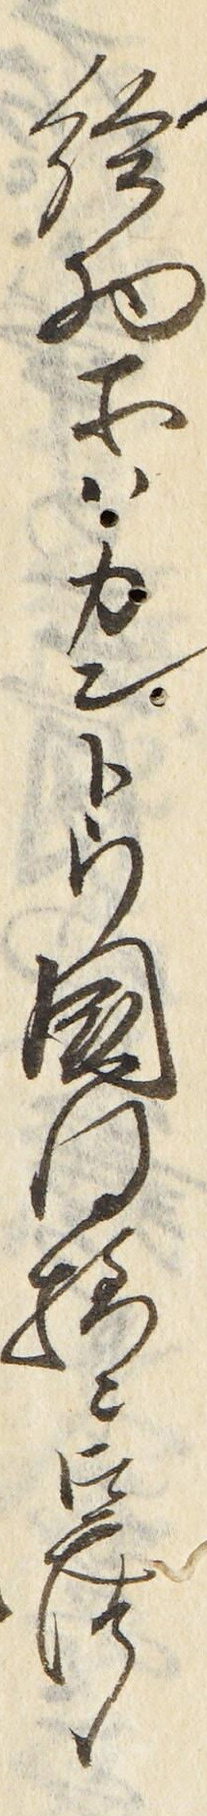給物等はカントウ国同様ニ御座候

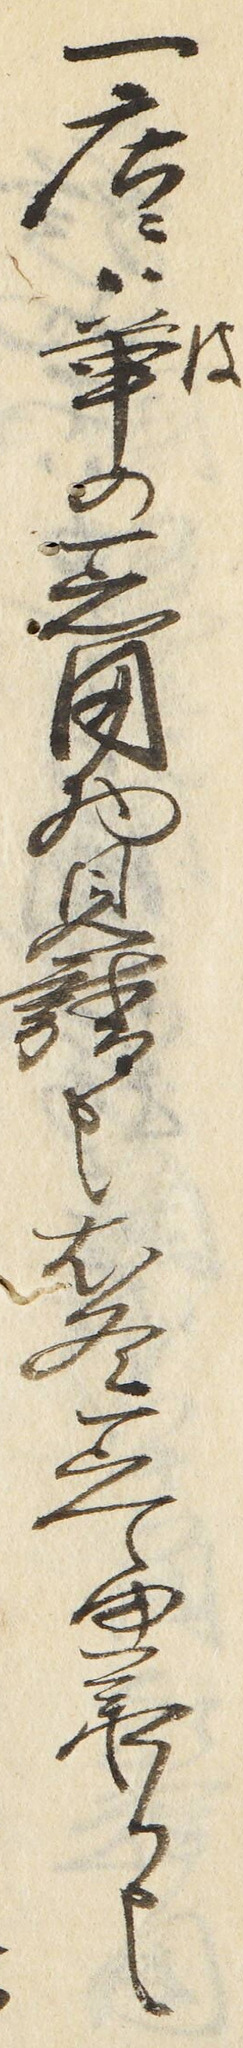一店ニは革の着用物身請申候尤冬着候由承り申候
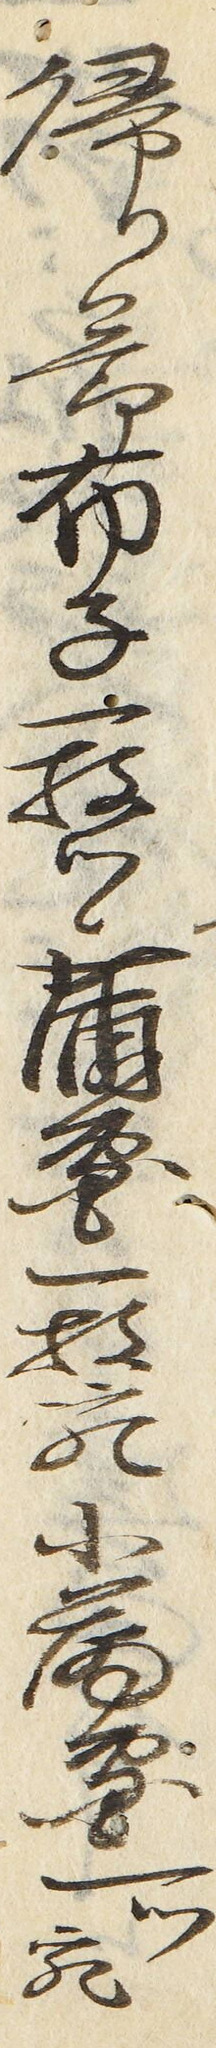帰り候節布子一枚ツヽ蒲団一枚宛小薦団一ツ宛
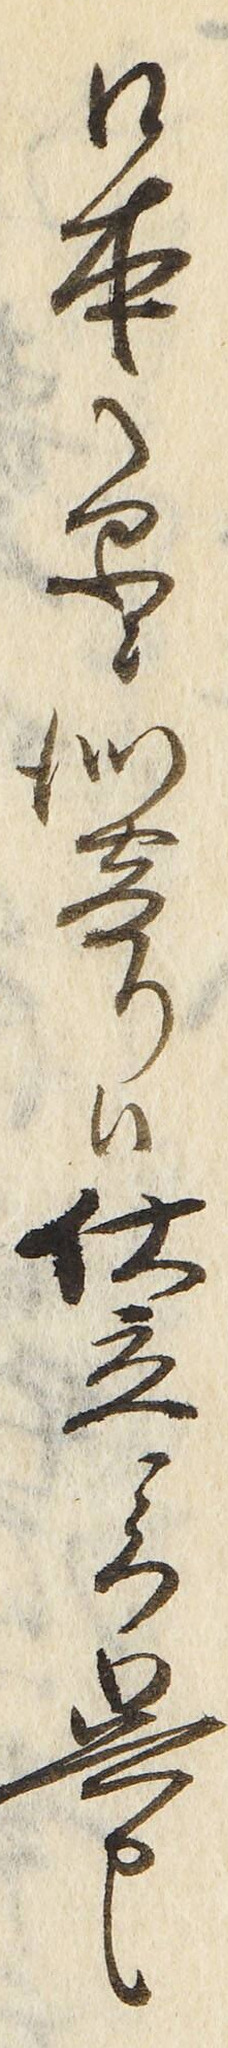日本之品も存寄り候仕立ニ而呉申候
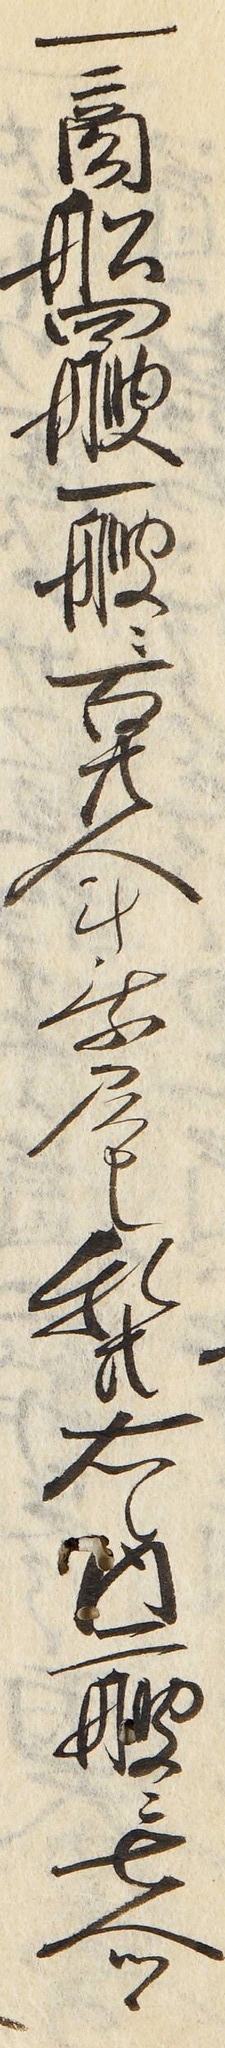一商船四艘一般ニ百廿人計乗居申候私共右の内二艘ニ七人ツヽ
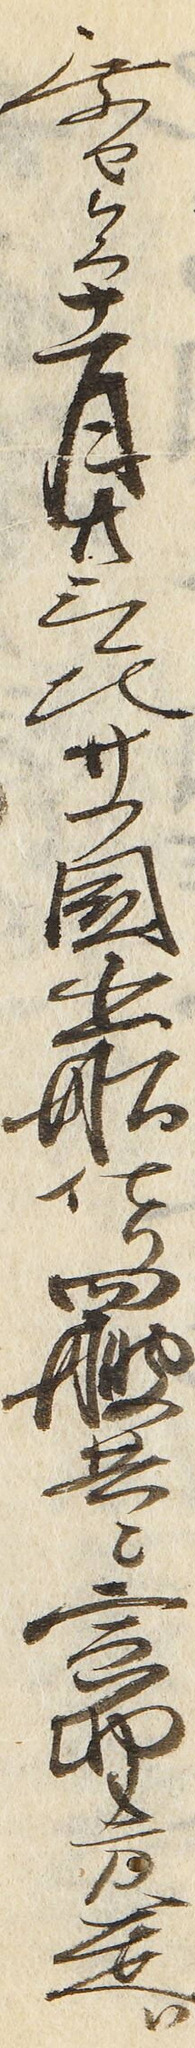乗セ候而十一月廿三日頃サフ国出船仕り四艘共ニ寅卯之方へ走り
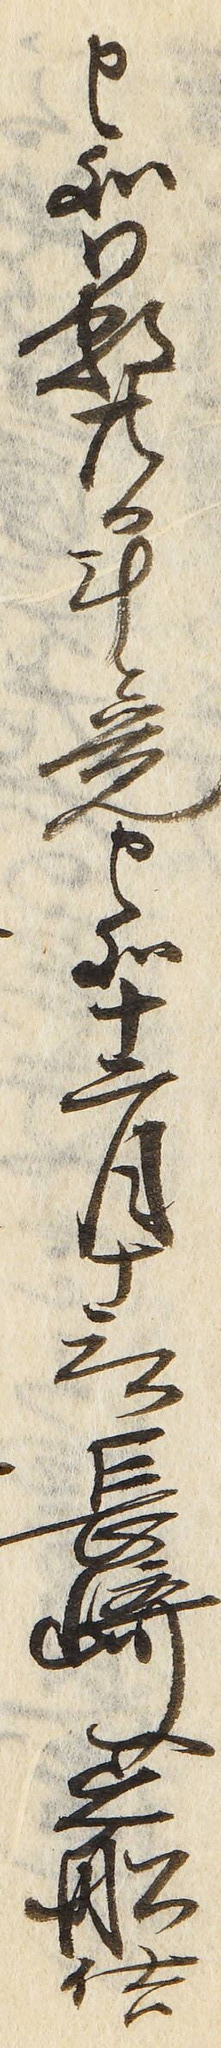申候処日数廿日計と覚申候処十二月十三日長崎へ着船仕候
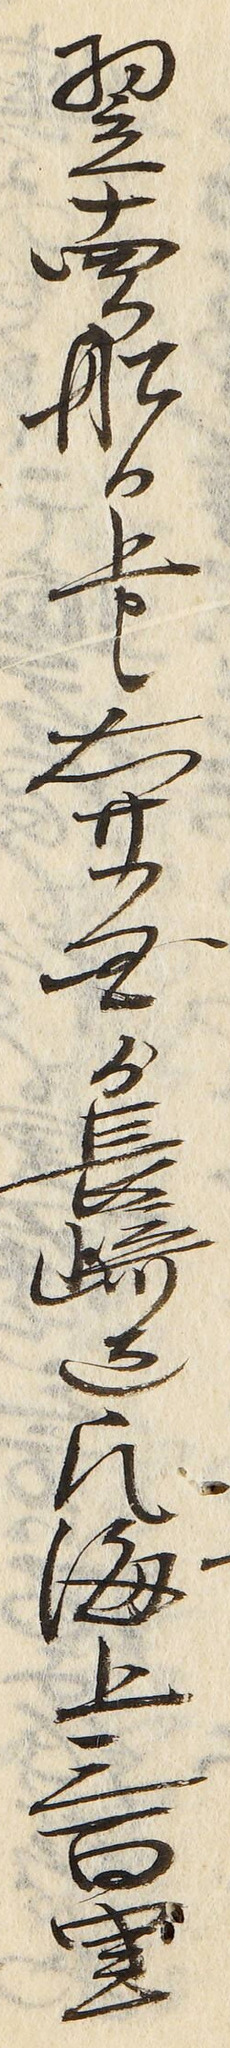翌十四日船ゟ上申候右サフ国ゟ長崎迄凡海上三百里
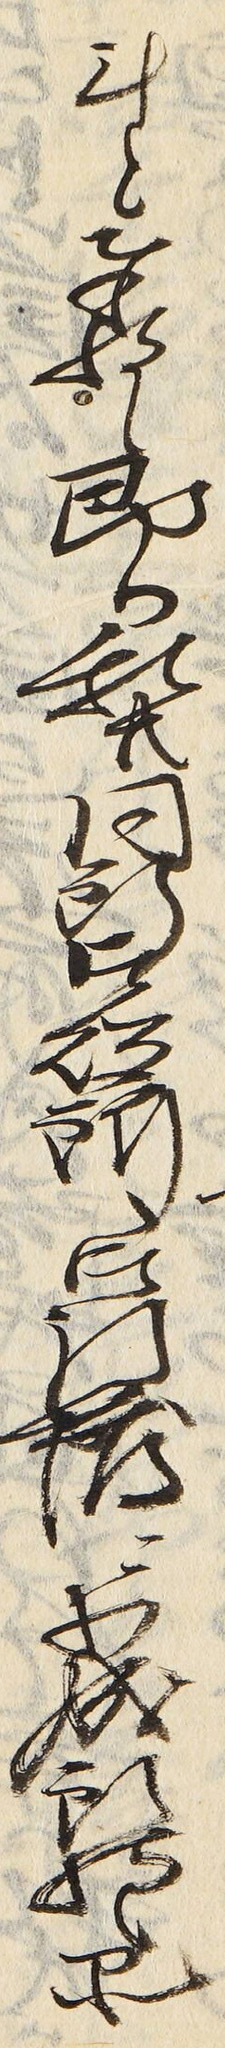計と奉存候即ち私共同所御役所へ御引渡ニ相成所持候品
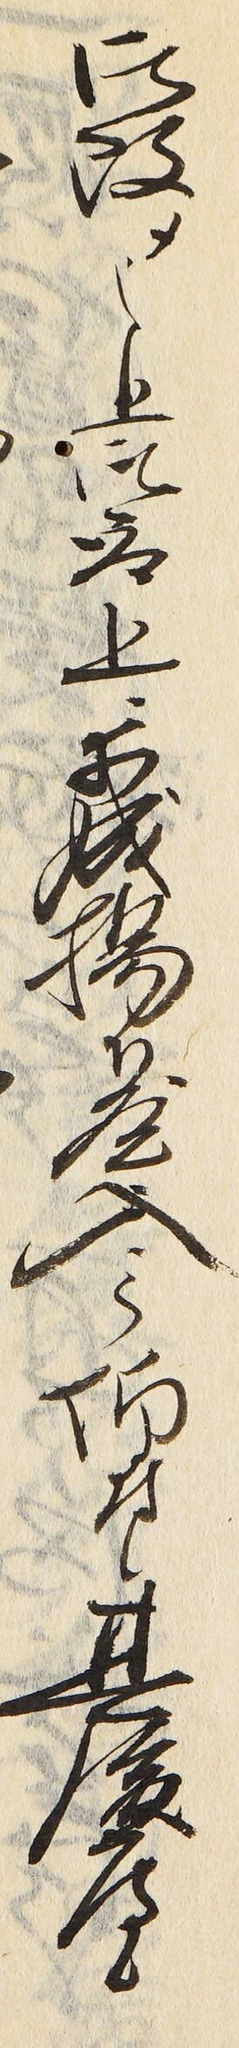御改メ之上御取上ニ相成揚り屋入被仰付候其後度々
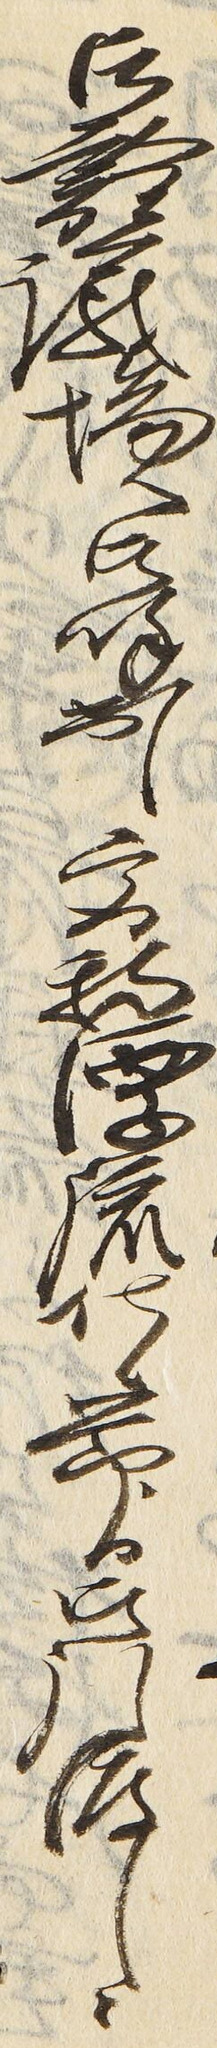御詮議場へ御呼出し最初漂流仕候節ゟ御引渡しニ
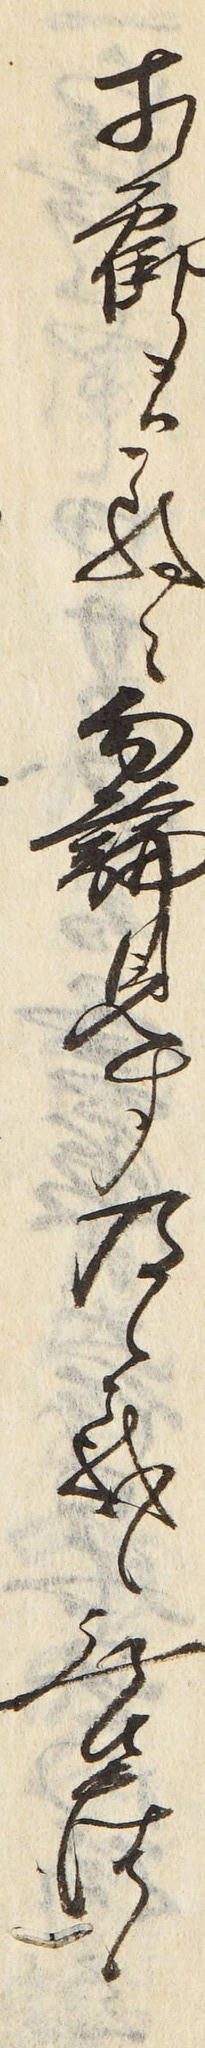相勧メ候義ニ勿論見聞及候義も無御座候
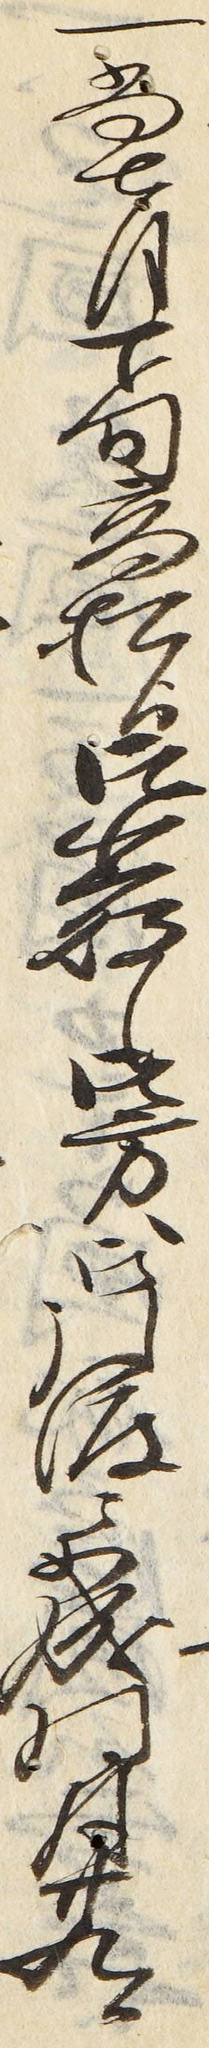一当七月下旬商船ゟ御出役候御方へ御引渡ニ相成同月廿九日
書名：漂流記
